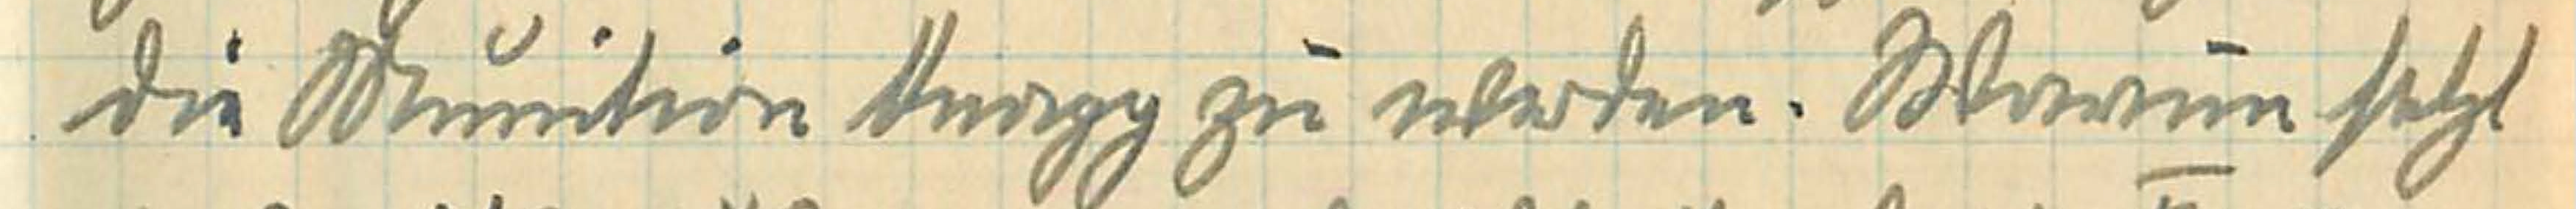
die Munition knapp zu werden. Warum setzt
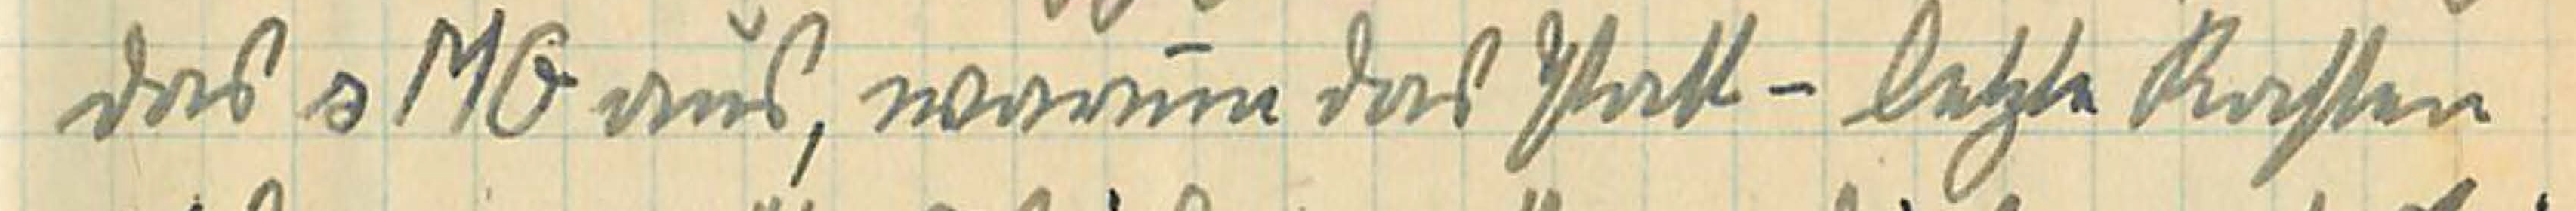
das s MG aus, warum das Pak – letzte Kasten
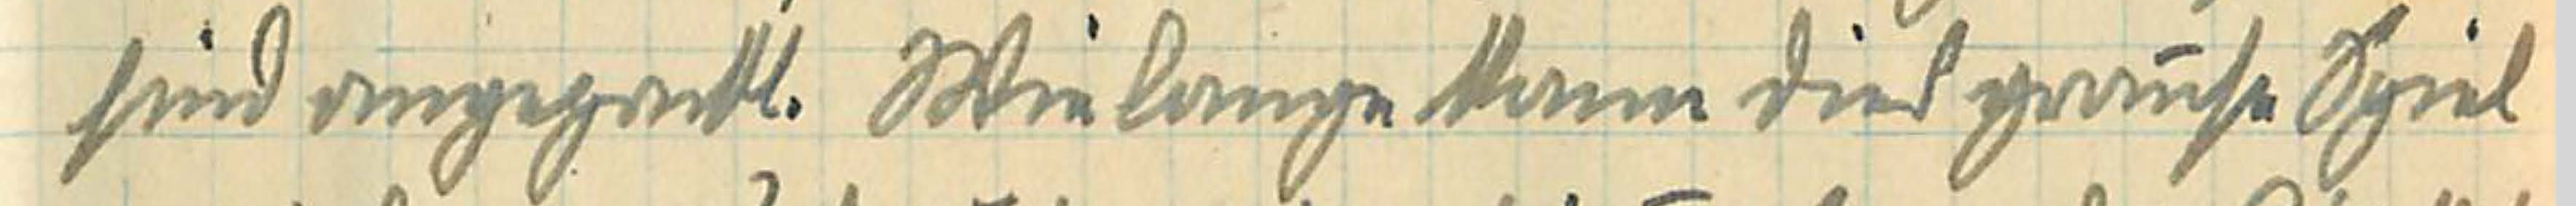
sind angepackt. Wie lange kann dies grause Spiel
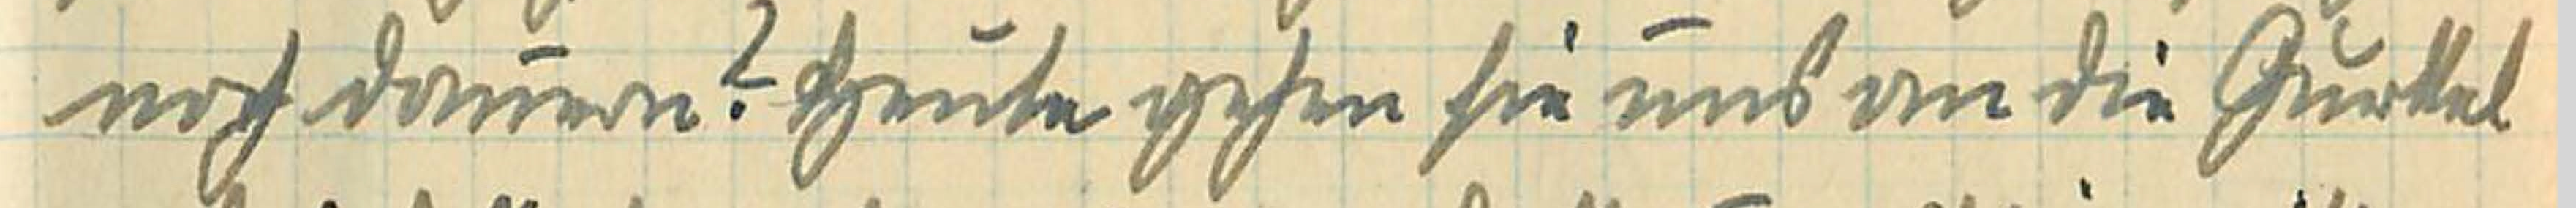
noch dauern? Heute gehen sie uns an die Gurkel
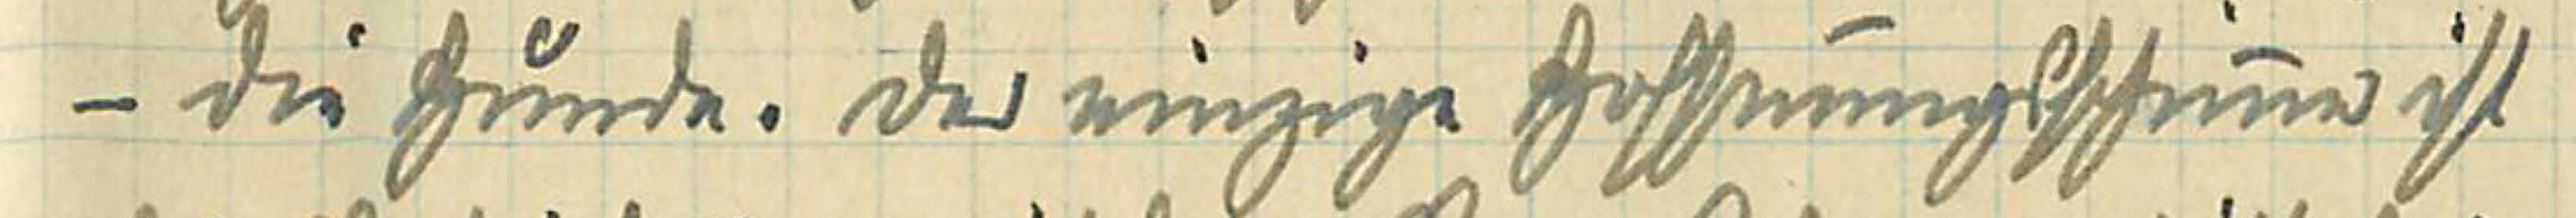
– die Hunde. Der einzige Hoffnungsschimmer ist
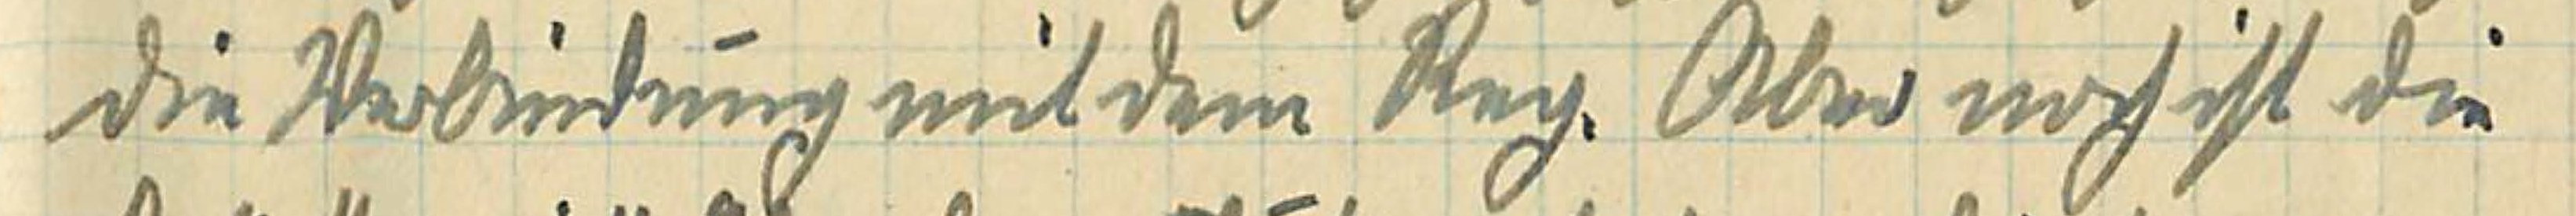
die Verbindung mit dem Reg. Aber noch ist die
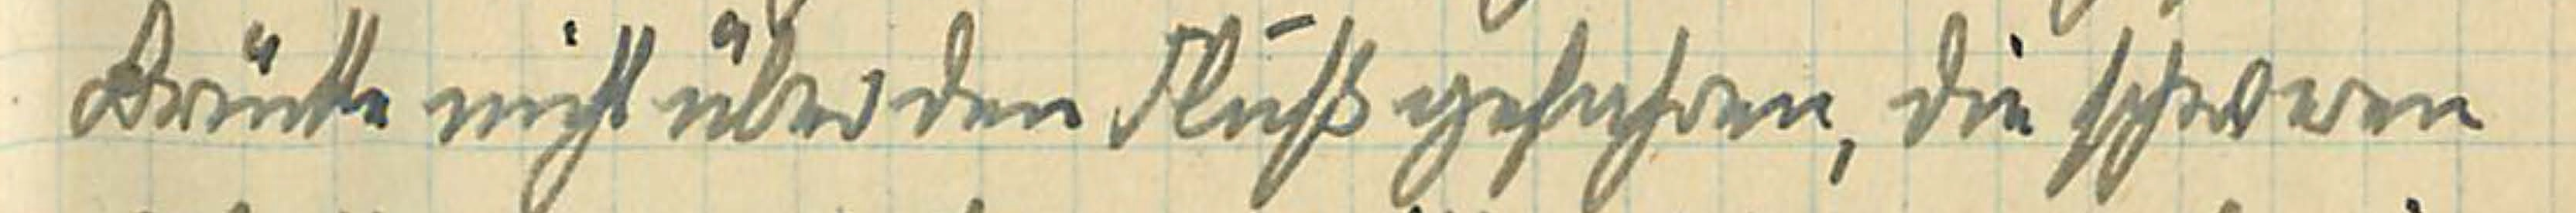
Brücke nicht über den Fluß gefahren, die schweren
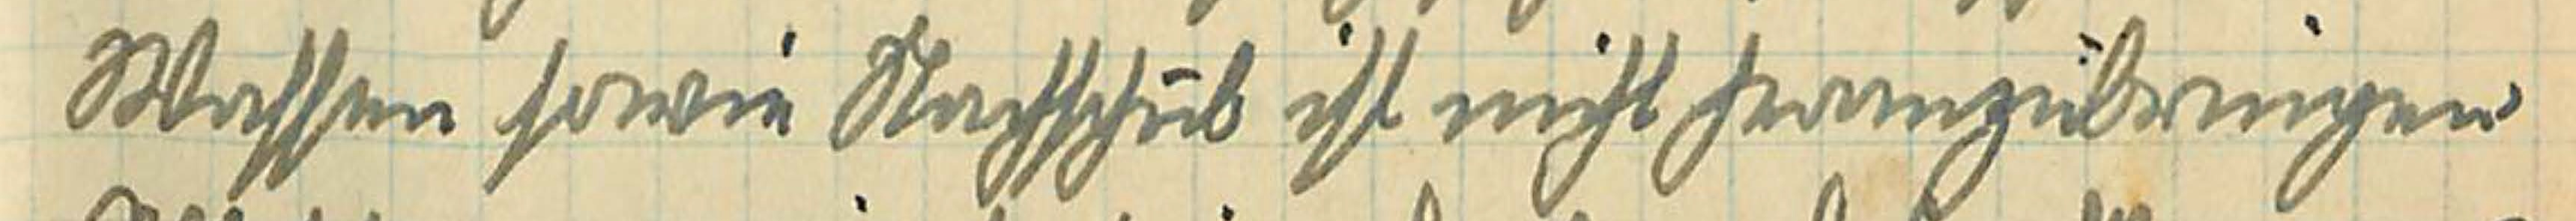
Waffen sowie Nachschub ist nicht heranzubringen.
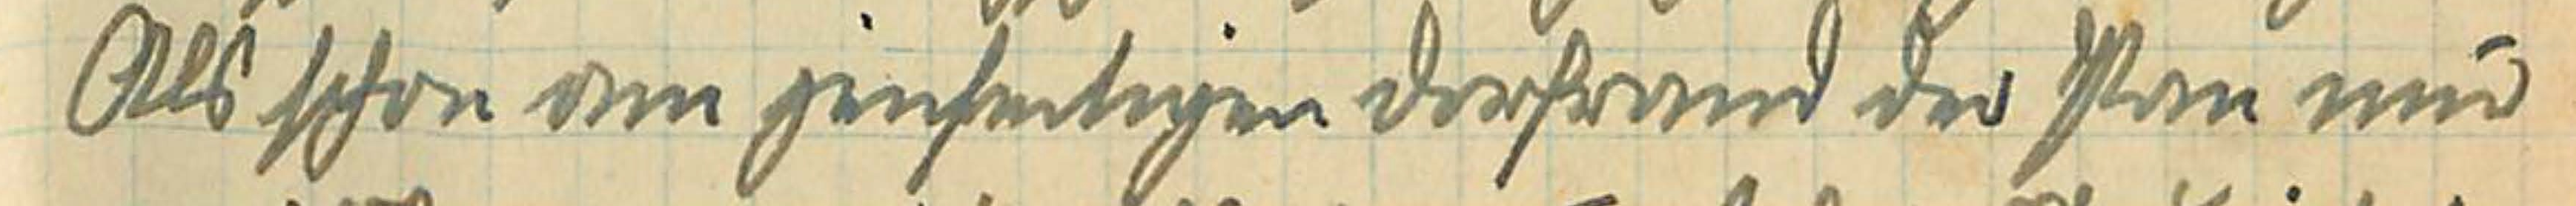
Als schon am jenseitigen Dorfrand der Pan nur
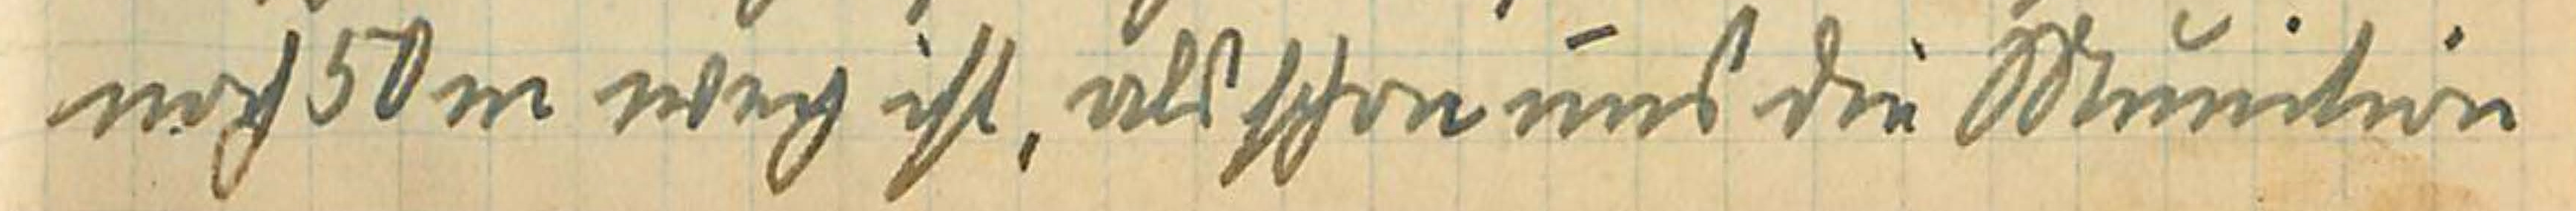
noch 50 m weg ist, als schon uns die Munition
